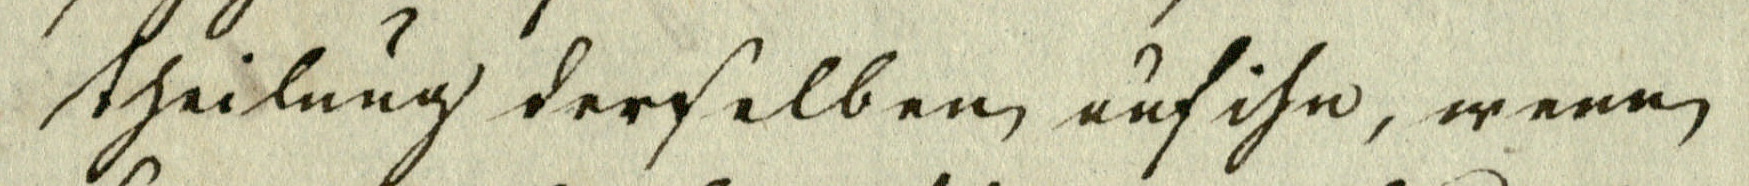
theilung derselben, auf ihn, wenn
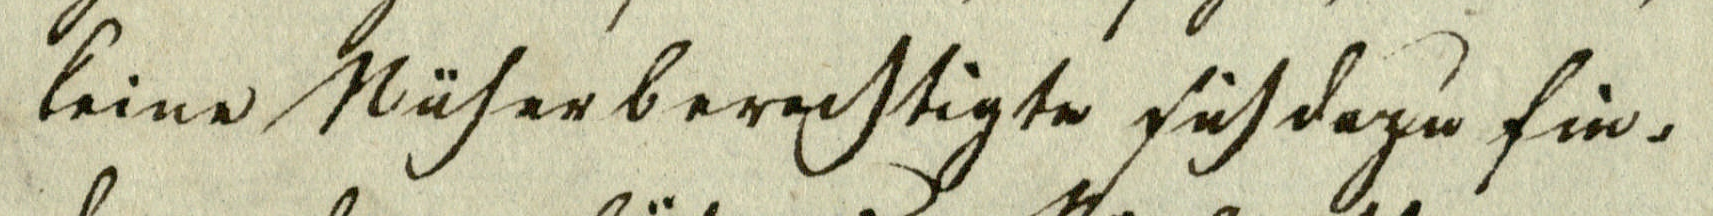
keine Näherberechtigte sich dazu fin¬
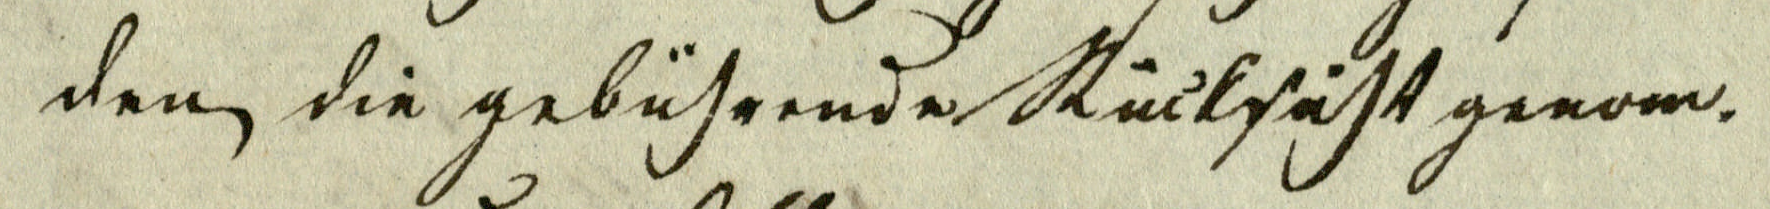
den die gebührende Rücksicht genom¬
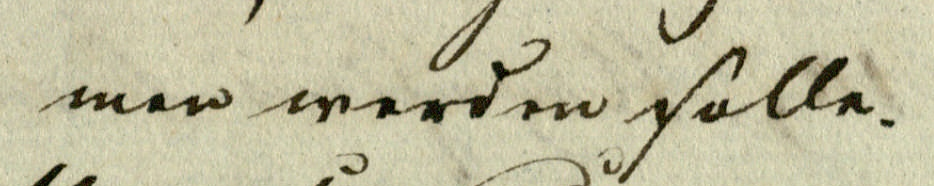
men werden solle.
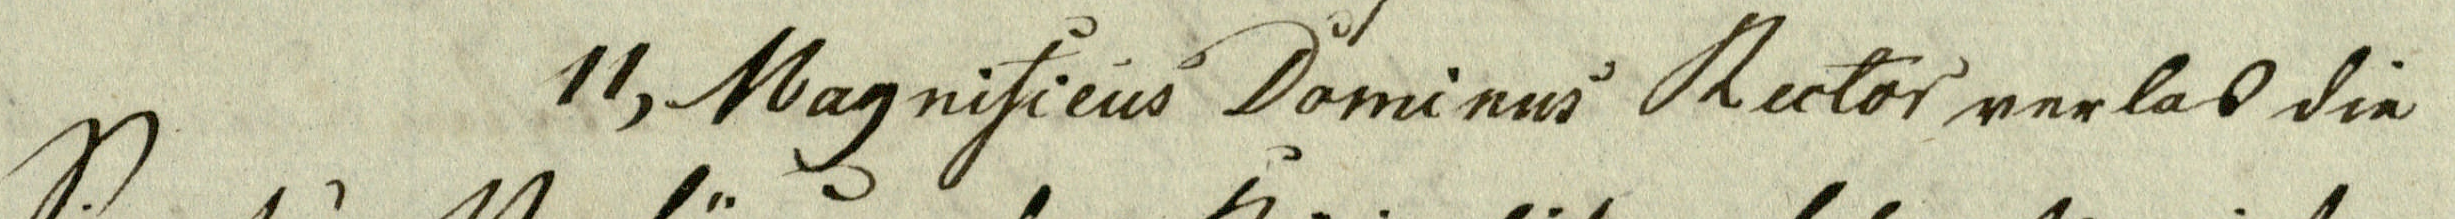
11, Magnificus Dominus Rector verlas die
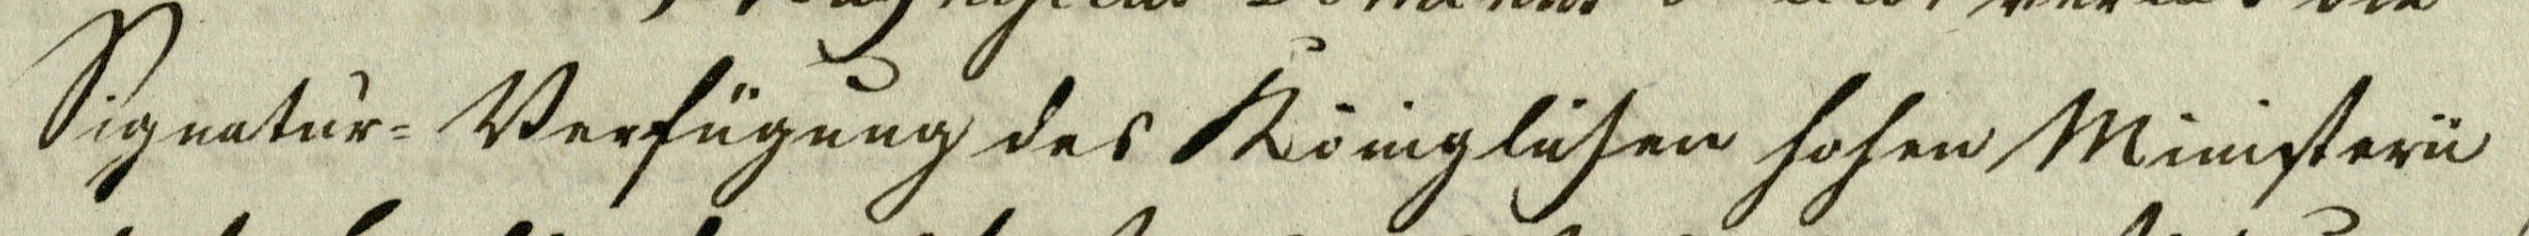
Signatur-Verfügung des Königlichen hohen Ministerii
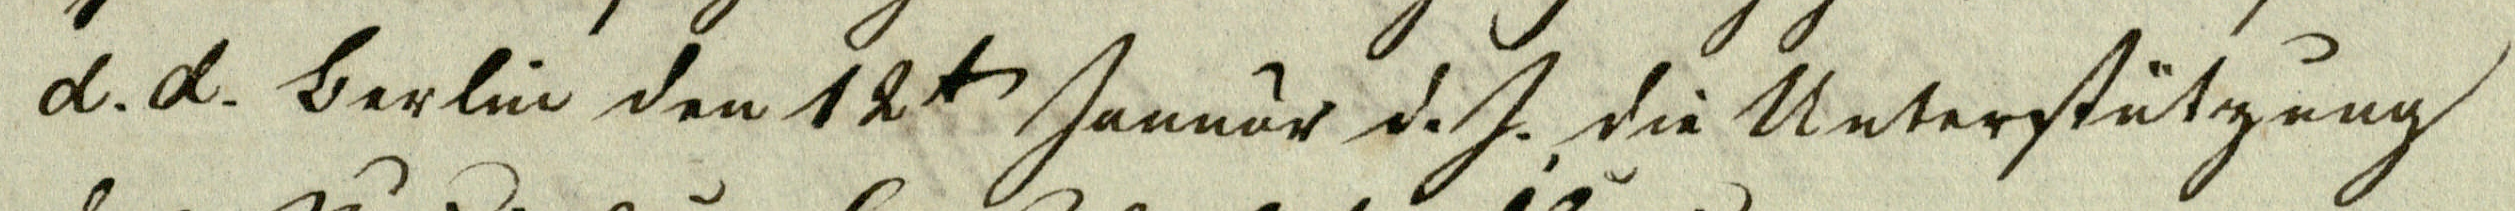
d. d. Berlin den 12ten Januar d. J. die Unterstützung
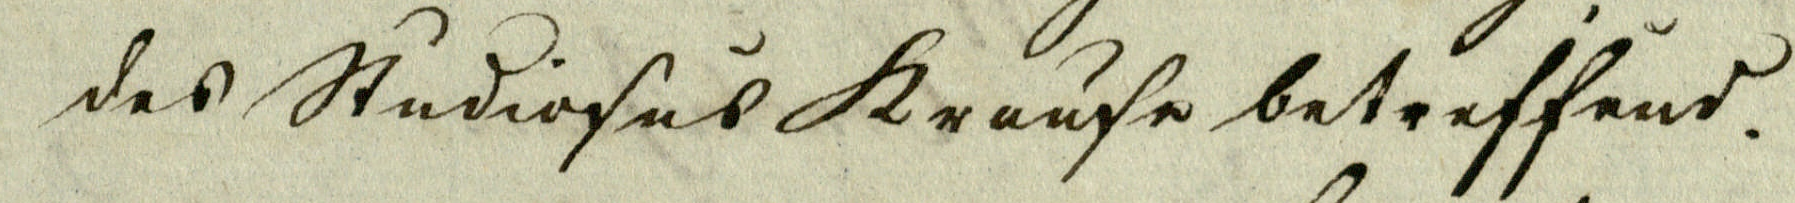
des Studiosus Krause betreffend.
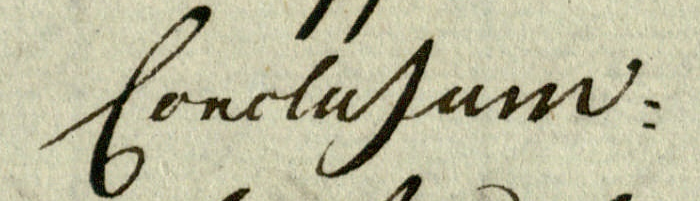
Conclusum:
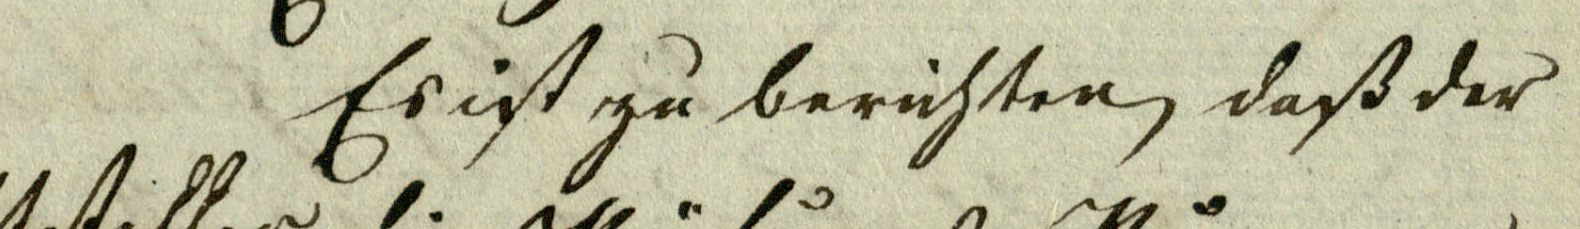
Es ist zu berichten, daß der
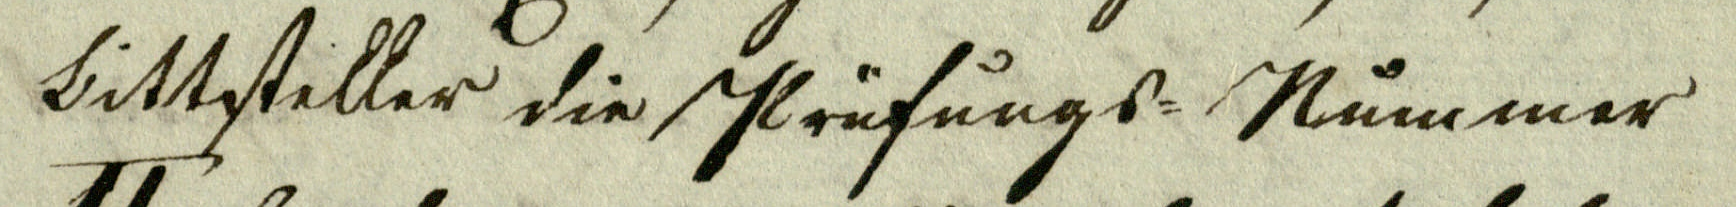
Bittsteller die Prüfungs-Nummer
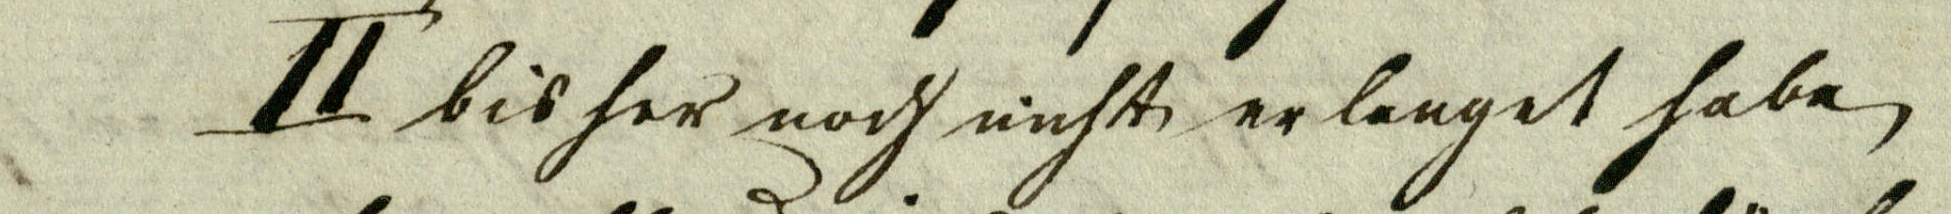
II bisher noch nicht erlanget habe,
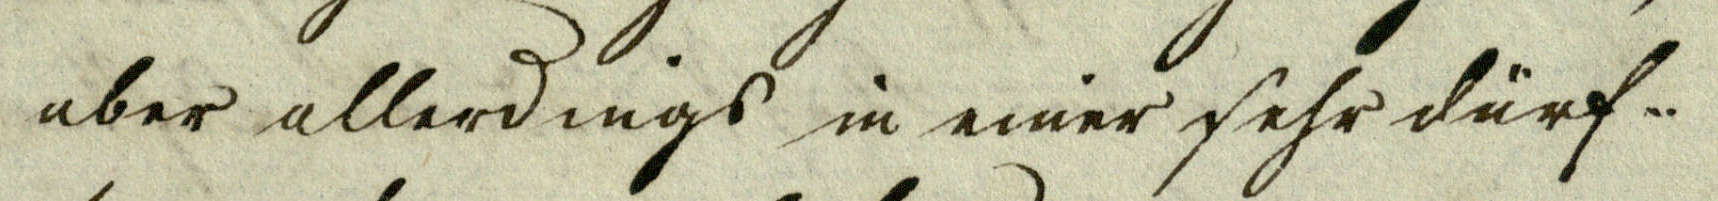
aber allerdings in einer sehr dürf¬
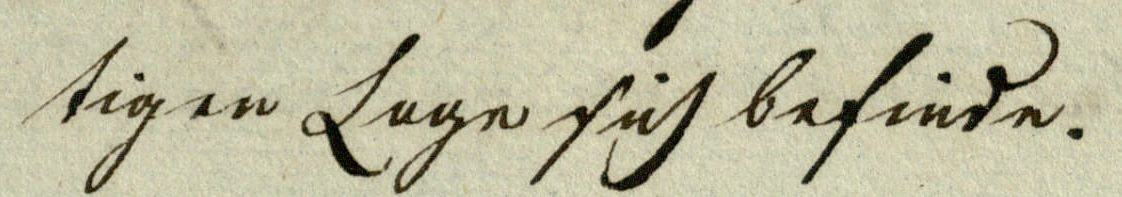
tigen Lage sich befinde.
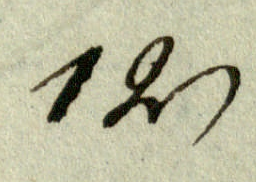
12
